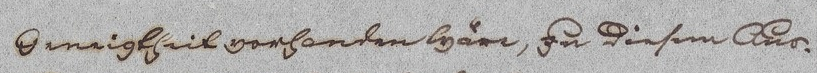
Geneigtheit vorhanden wäre, zu diesem Aus-
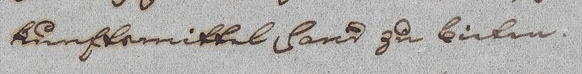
kunftsmittel Hand zu bieten.
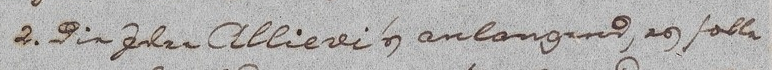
2. Die Idee Allievi's anlangend, es solle
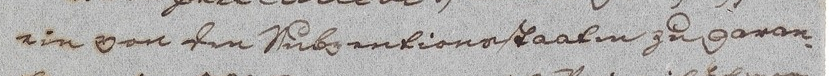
ein von den Subventionsstaaten zu garan-
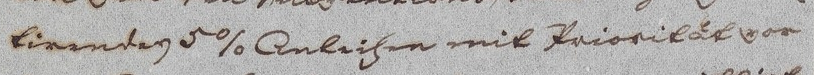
tirendes 5% Anleihen mit Priorität vor
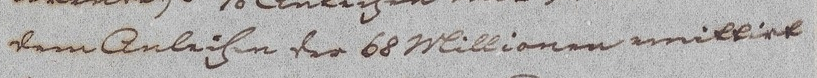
dem Anleihen der 68 Millionen emittirt
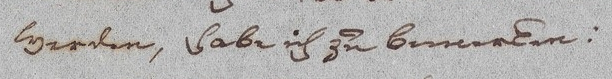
werden, habe ich zu bemerken:
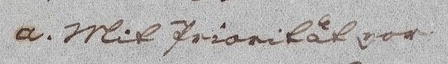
a. Mit Priorität vor
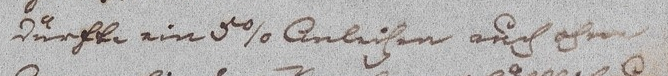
dürfte ein 5% Anleihen auch ohne
